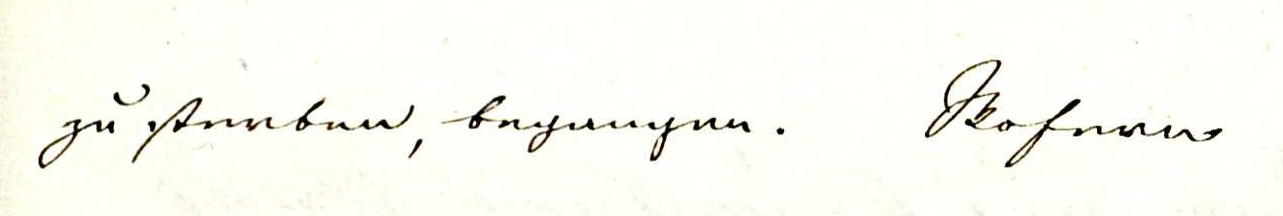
zu sterben, begangen. Sofern
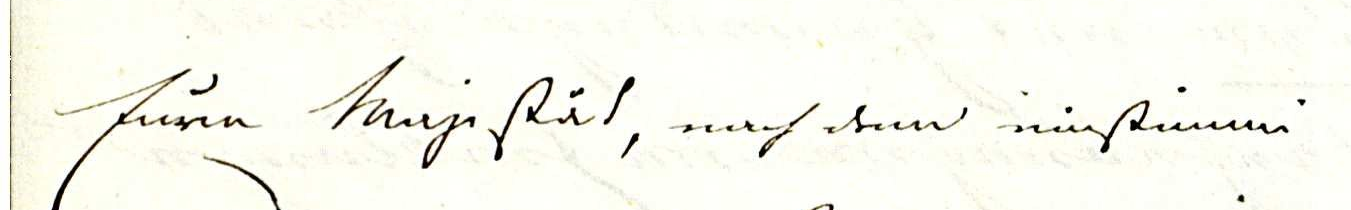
Eure Majestät, nach dem einstimmi
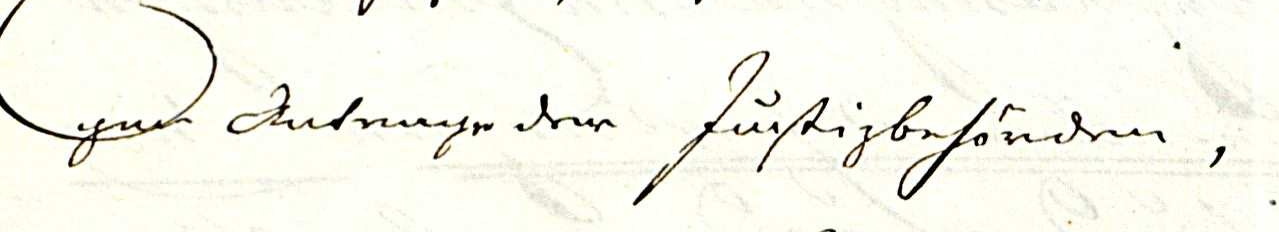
gen Antrage der Justizbehörden,
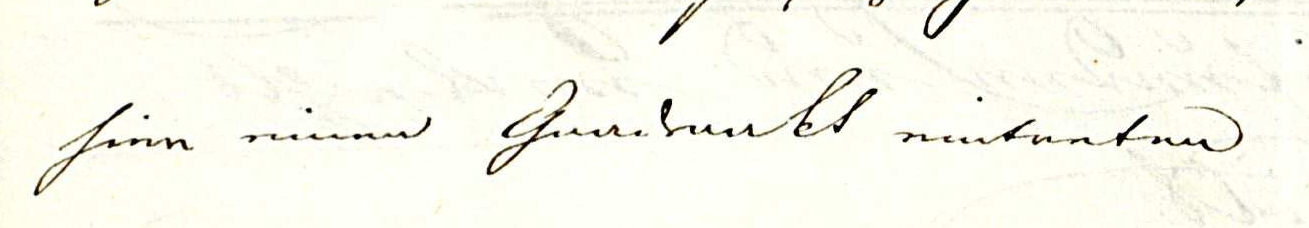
hier einen Gnadenakt mitunter
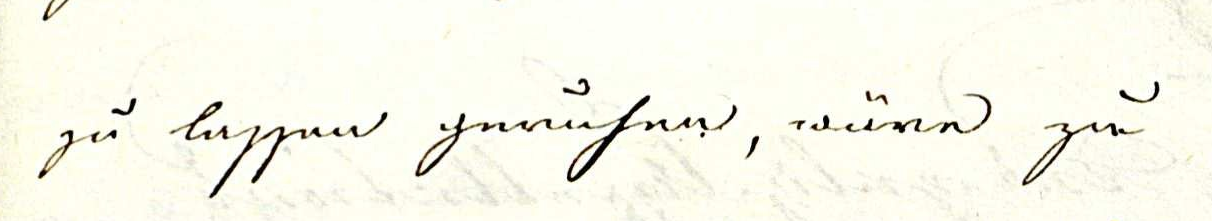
zu lassen geruhen, wäre zu
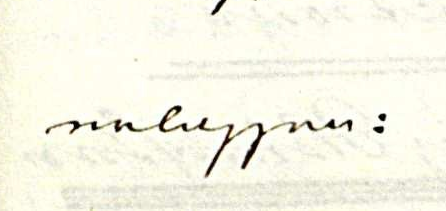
anlassen:
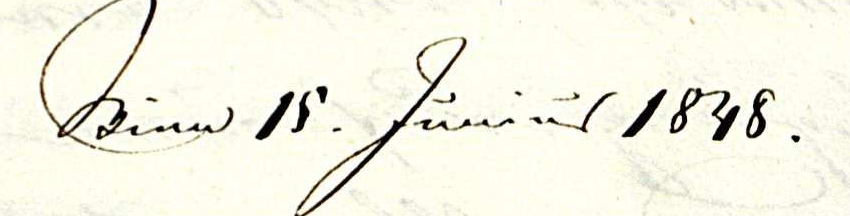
Wien 15 Juni 1848
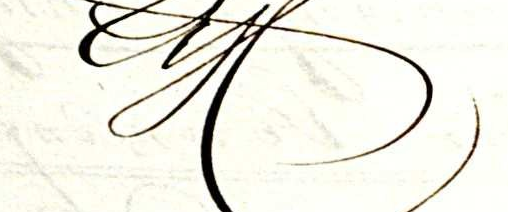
AhE
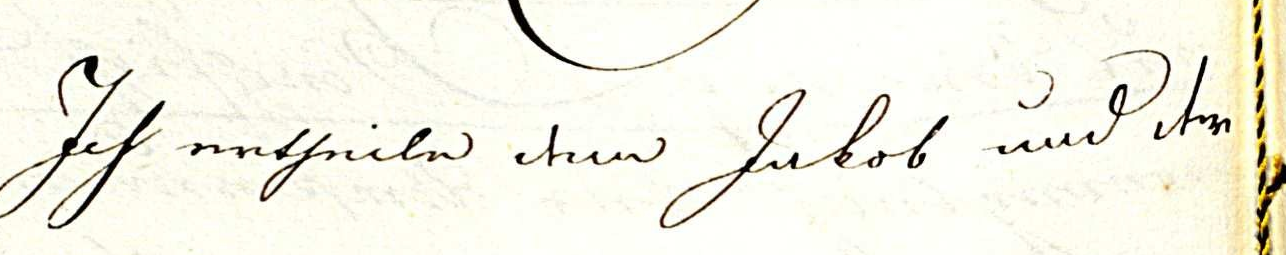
Ich ertheile den Jakob und der
